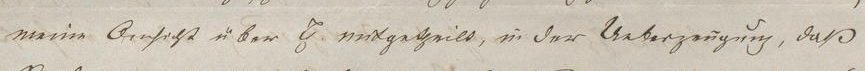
meine Ansicht über Th. mitgetheilt, in der Ueberzeugung, daß
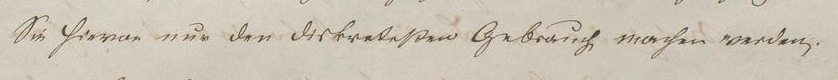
Sie hievon nur den diskretesten Gebrauch machen werden.» –
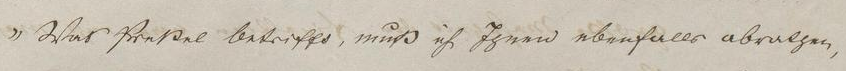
«Was Preßel betrifft, muß ich Ihnen ebenfalls abrathen,
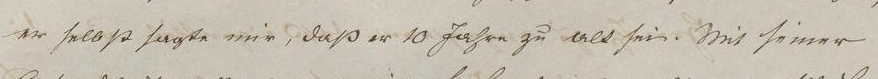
er selbst sagte mir, daß er 10 Jahre zu alt sei. Mit seiner
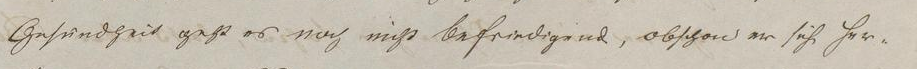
Gesundheit geht es noch nicht befriedigend, obschon er sich her-
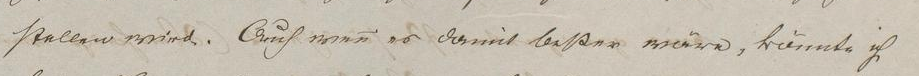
stellen wird. Auch wenn es damit beßer wäre, könnte ich
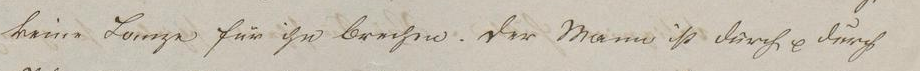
keine Lanze für ihn brechen. Der Mann ist durch & durch
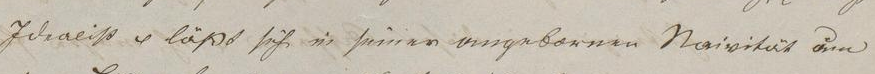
Idealist & läßt sich in seiner angebornen Naivität um
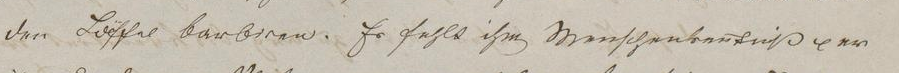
den Löffel barbiren. Es fehlt ihm Menschenkenntniß & er
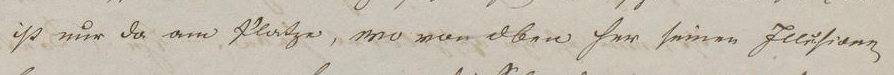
ist nur da am Platze, wo von oben her seinen Illusionen
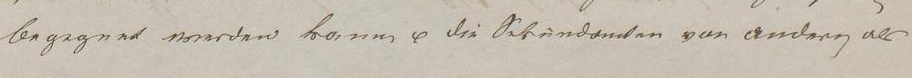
begegnet werden kann & die Sekundanten von andern als
